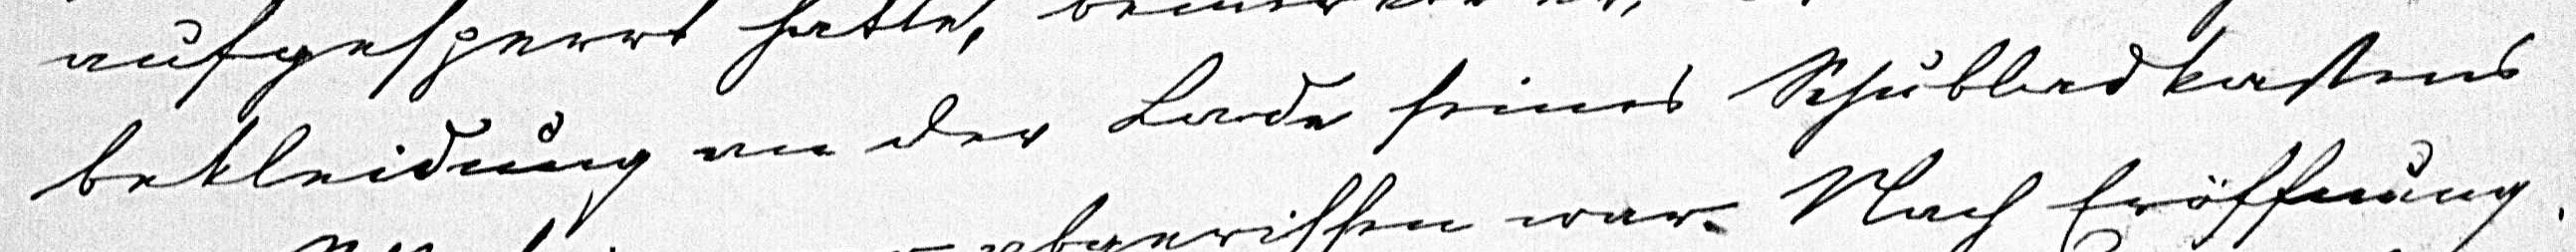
bekleidung an der Lade seines Schubladkastens
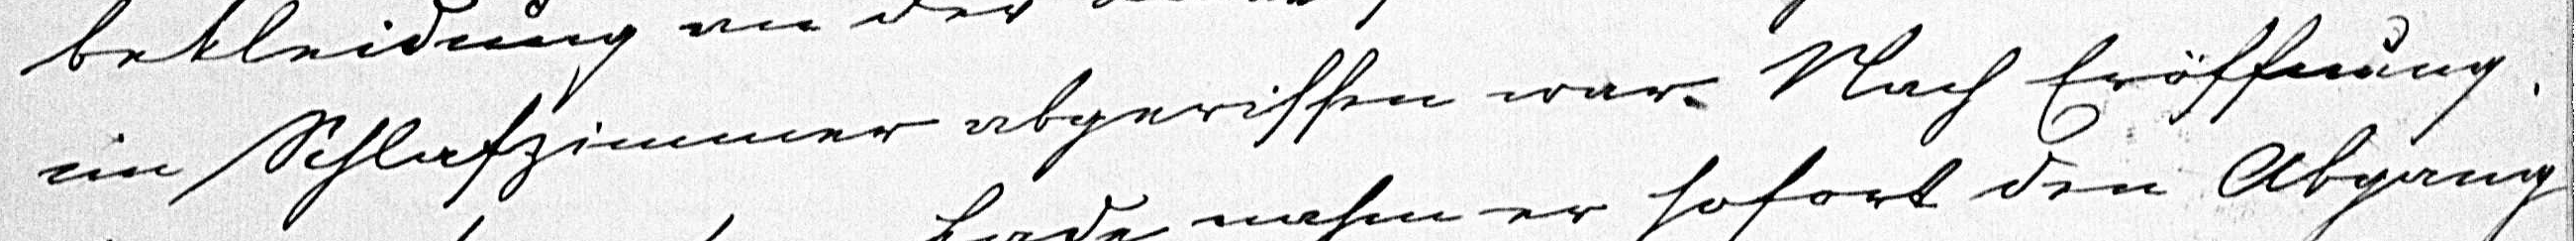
im Schlafzimmer abgerissen war. Nach Eröffnung
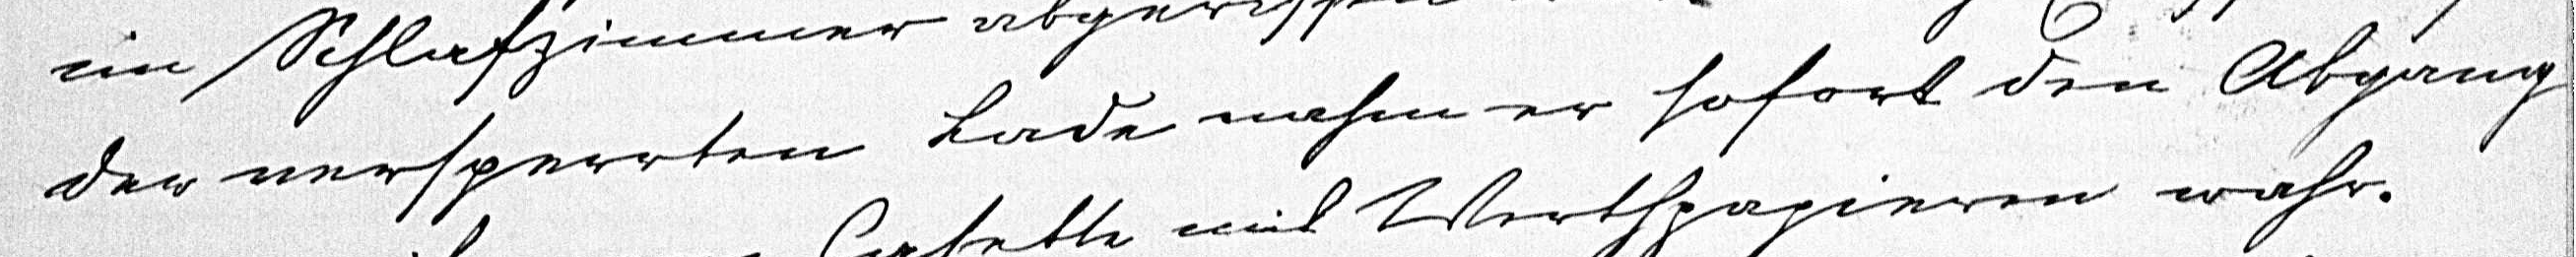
der versperrten Lade nahm er sofort den Abgang
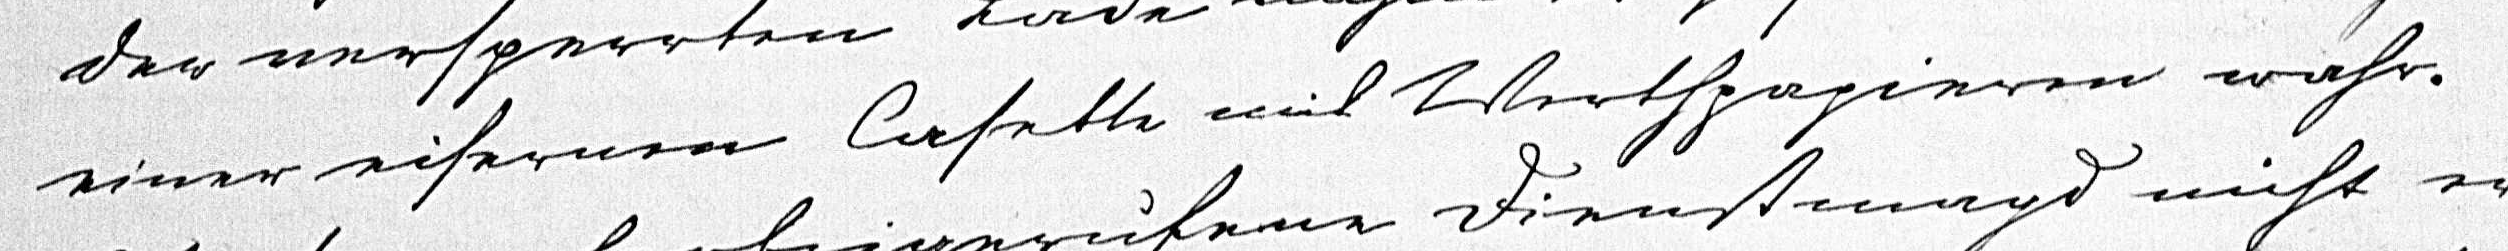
einer eisernen Casette mit Werthpapieren wahr.
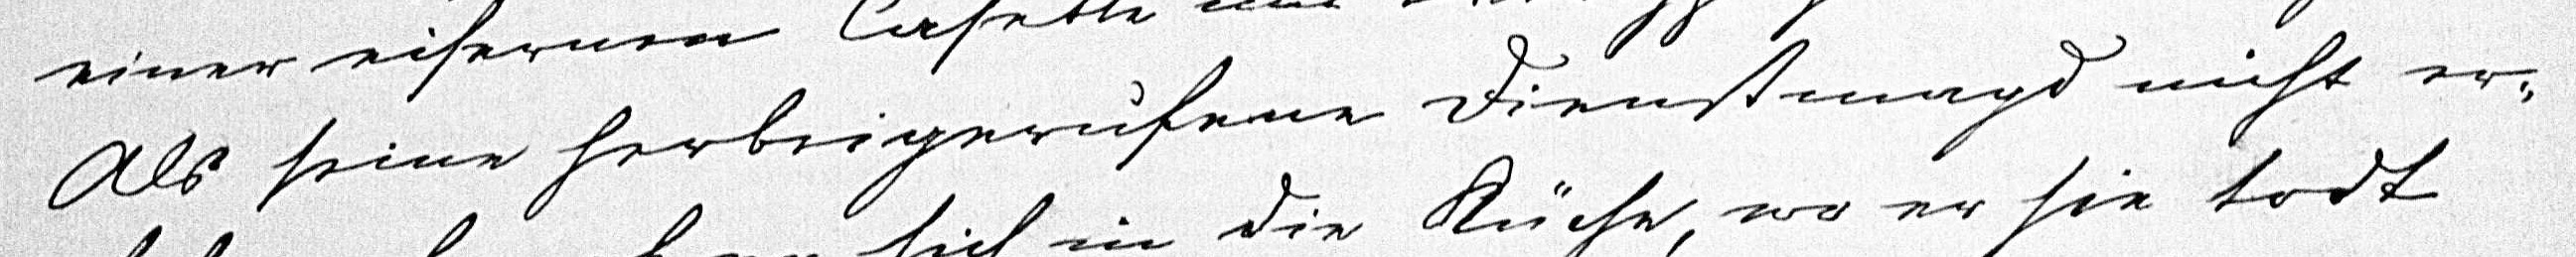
Also seine herbeigerufene Dienstmagd nicht er¬
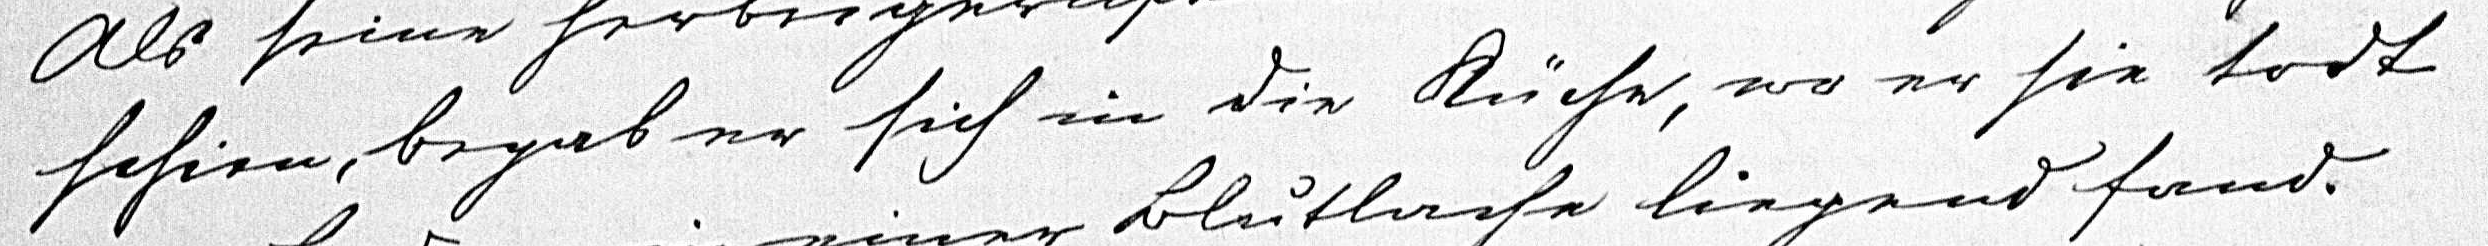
schien, begab er sich in die Küche, wo er sie todt
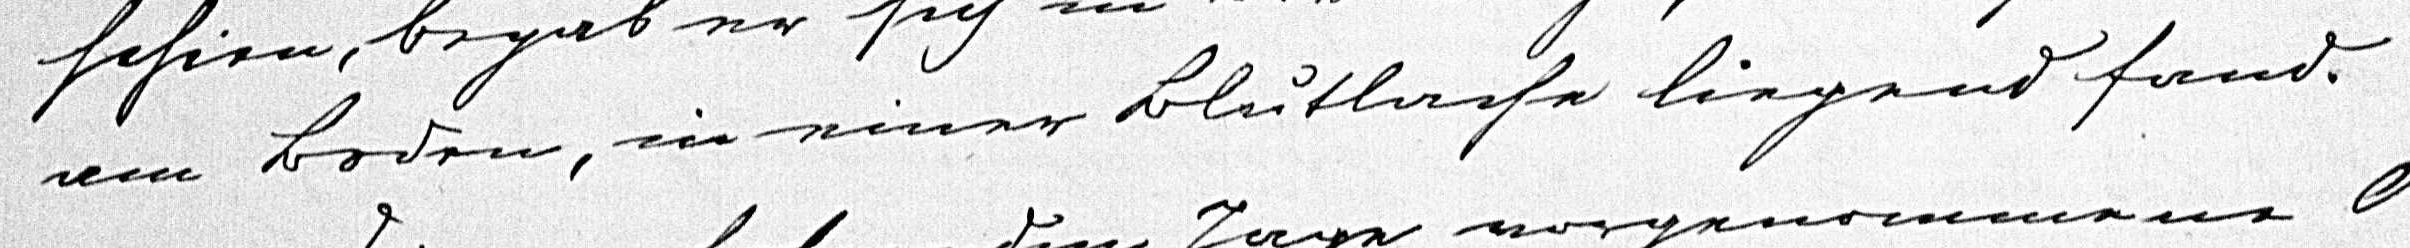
am Boden, in einer Blutlache liegend fand.
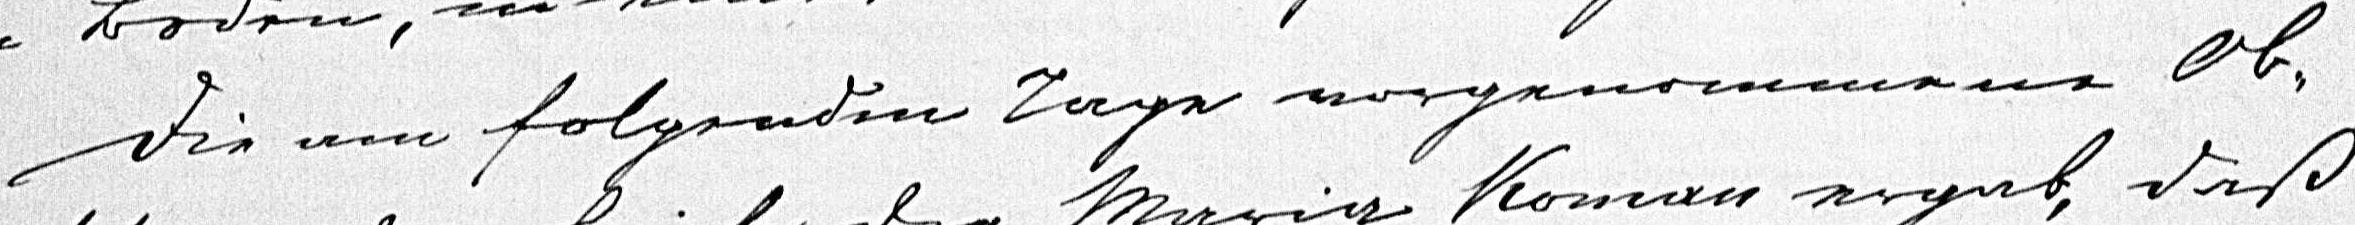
Die am folgenden Tage vorgenommene Ob¬
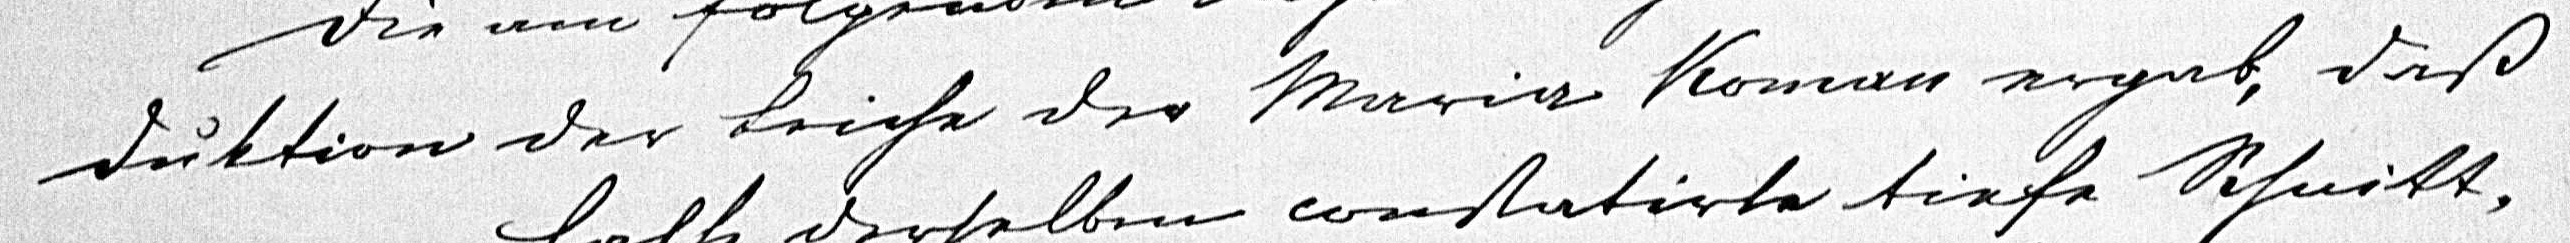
duktion der Leiche des Maria Koman ergab, daß
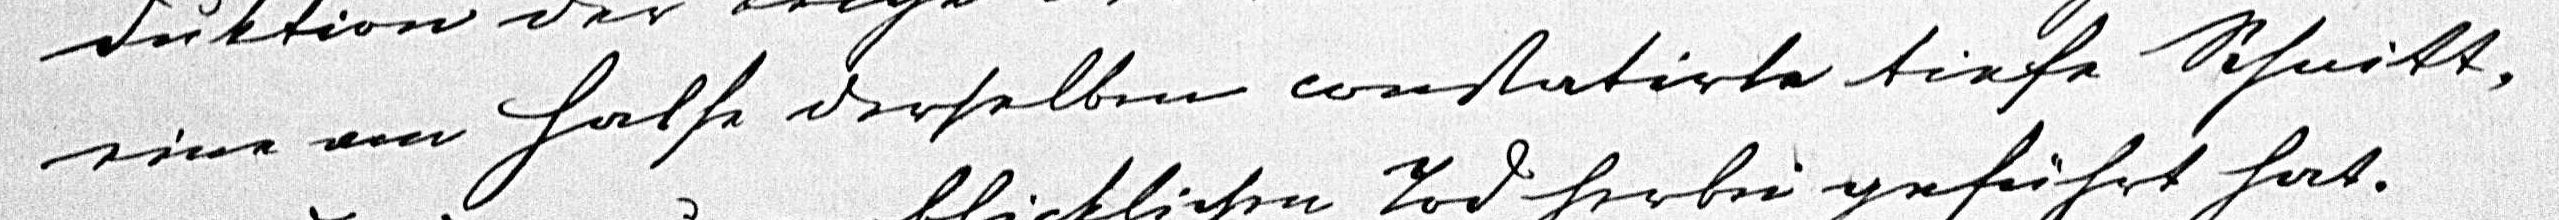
eine am Halse derselben constatirte tiefe Schnitt¬
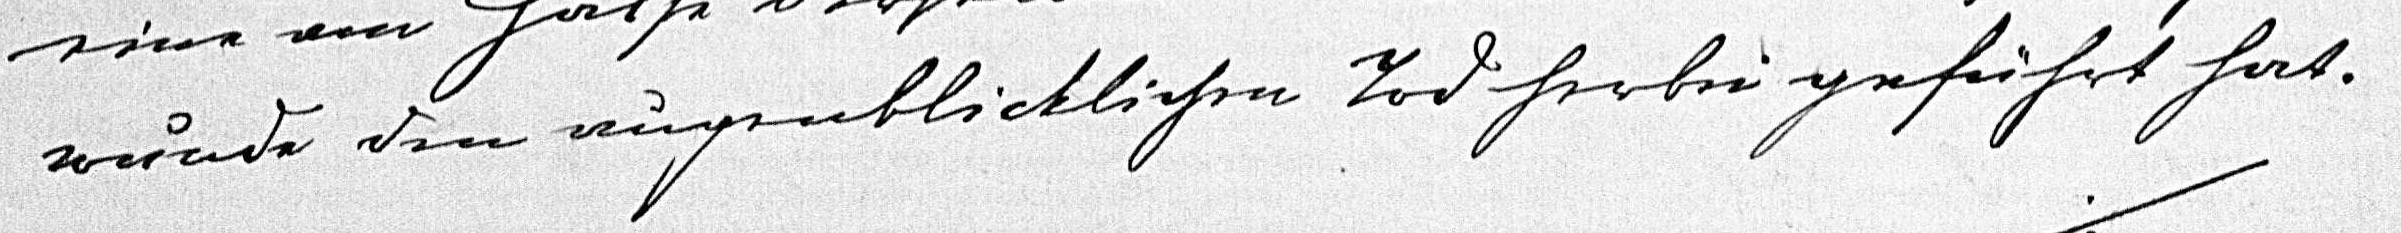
wunde den augenblicklichen Tod herbei geführt hat.
